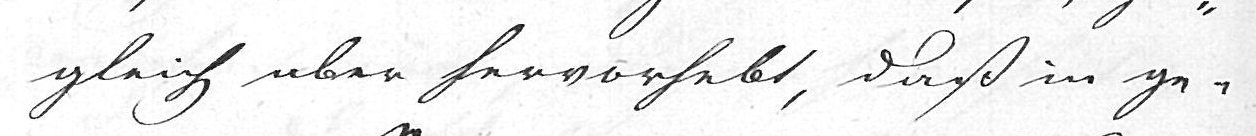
gleich aber hervorhebt, daß in ge-
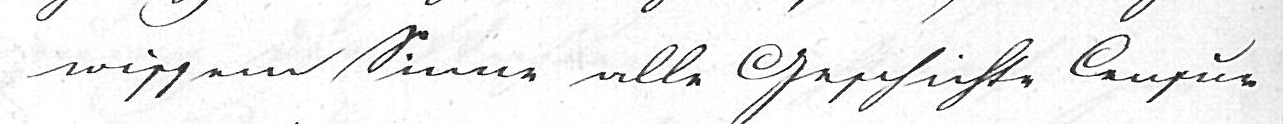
wissem Sinne alle Geschichte Censur
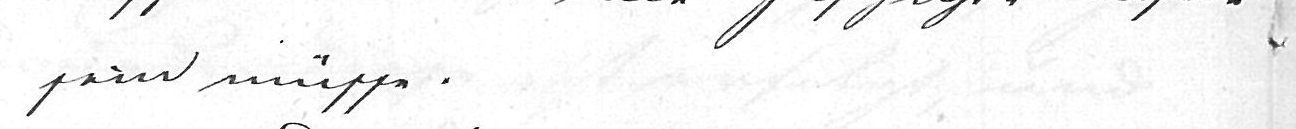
sein müsse.
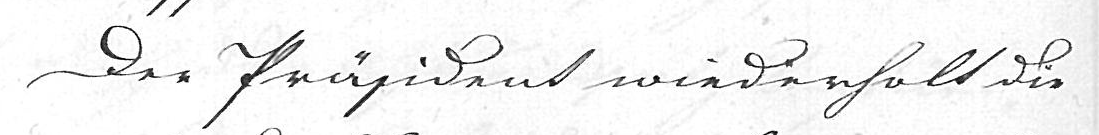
Der Präsident wiederholt die
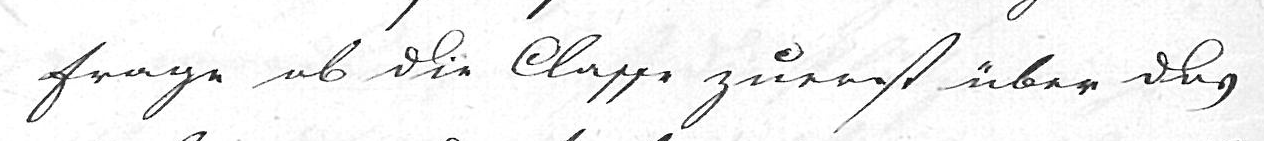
Frage ob die Classe zuerst über das
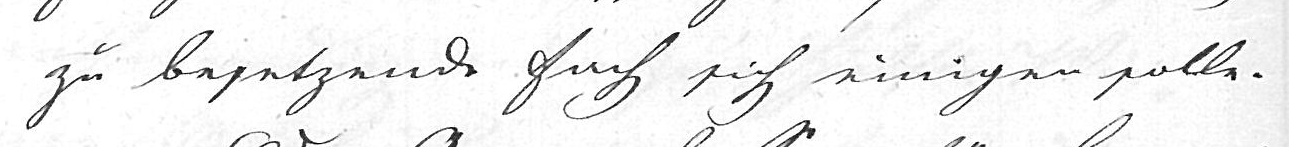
zu besetzende Fach sich einigen solle.
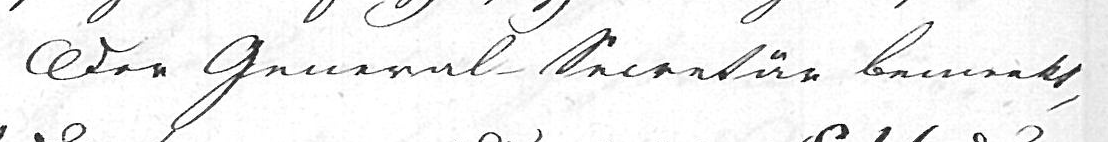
Der General-Secretär bemerkt,
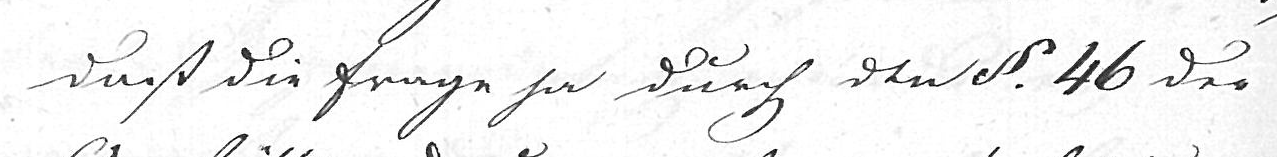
daß die Frage ja durch den § 46 der
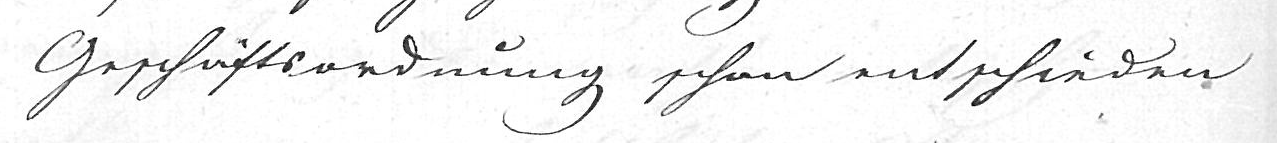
Geschäftsordnung schon entschieden
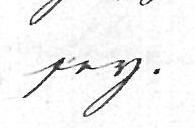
sey.
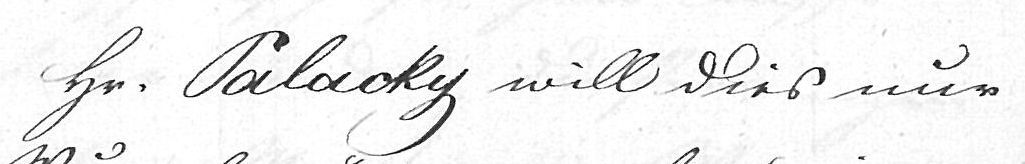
Hr. Palacky will dies nur
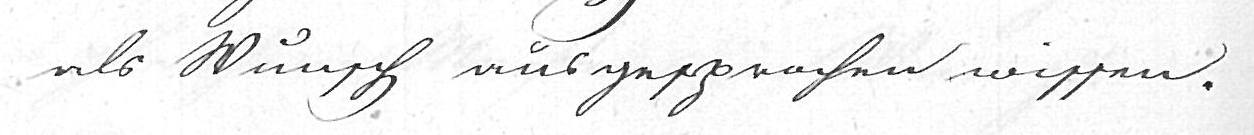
als Wunsch ausgesprochen wissen.
